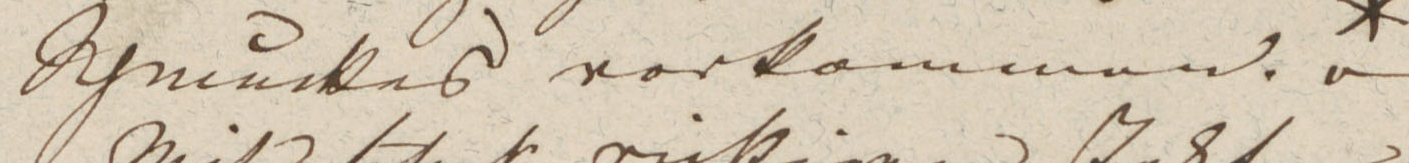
Schmuckes vorkommen. – . %
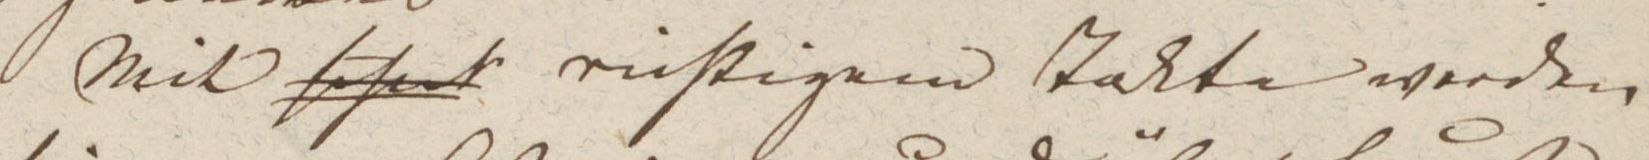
Mit sch richtigem Takte werden
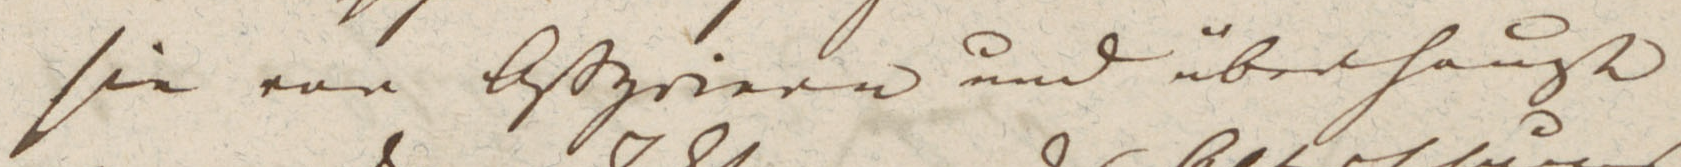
sie vor Assyriern und überhaupt
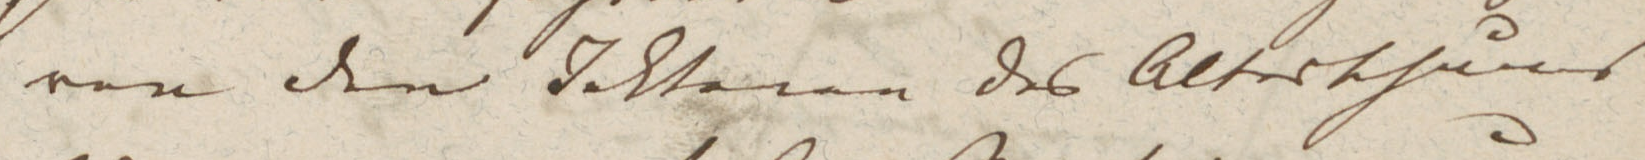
von den Tektonen des Alterhumes
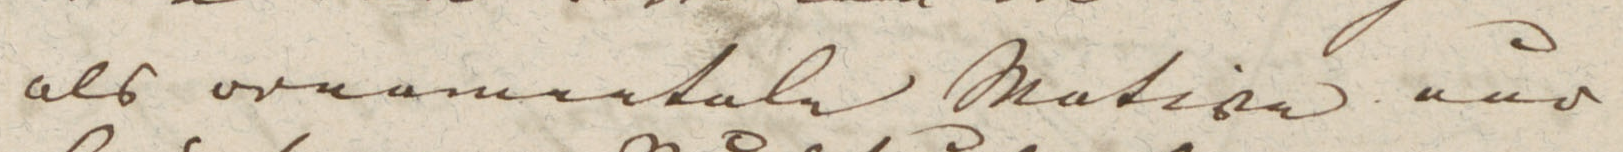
als ornamentale Motive nur
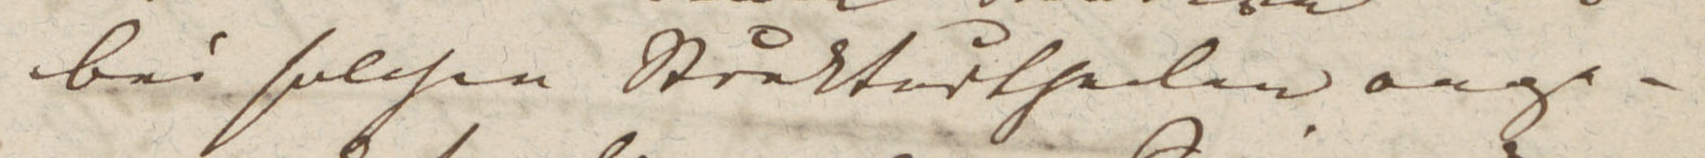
bei solchen Strukturtheilen ange-
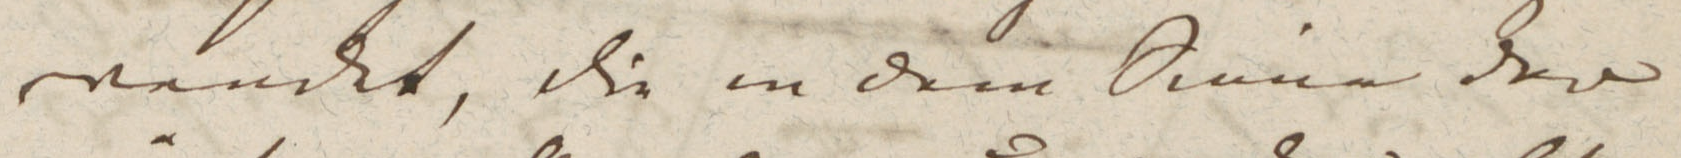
wendet, die in dem Sinne der
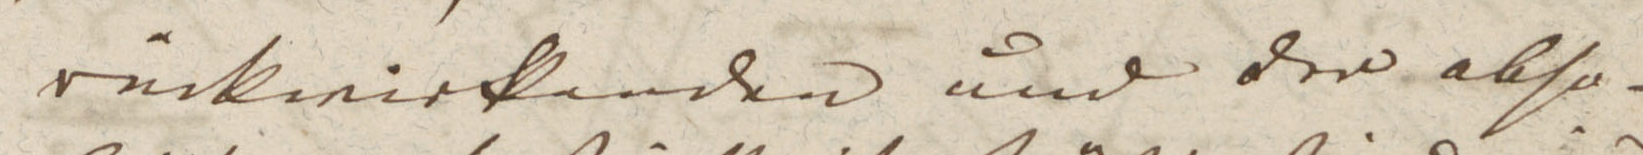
rückwirkenden und der abso-
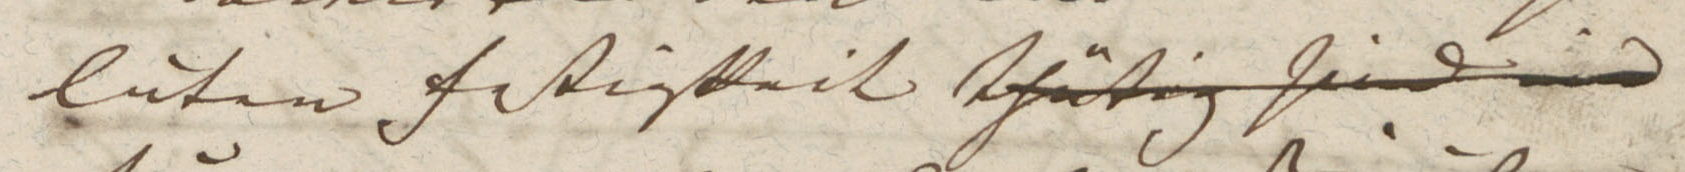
luten Festigkeit thätig sind und
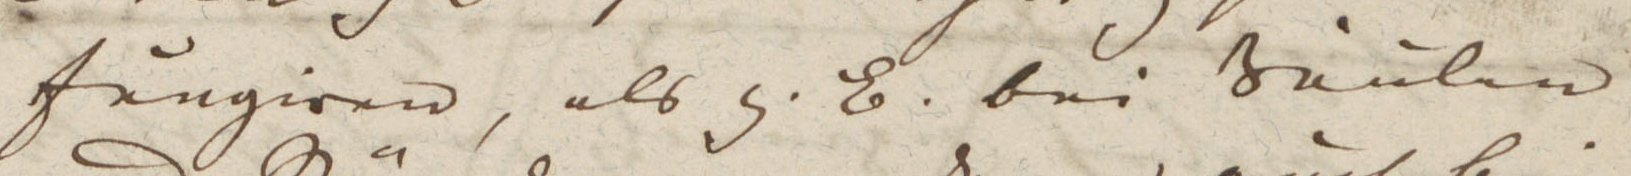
fungiren, als z. B. bei Säulen
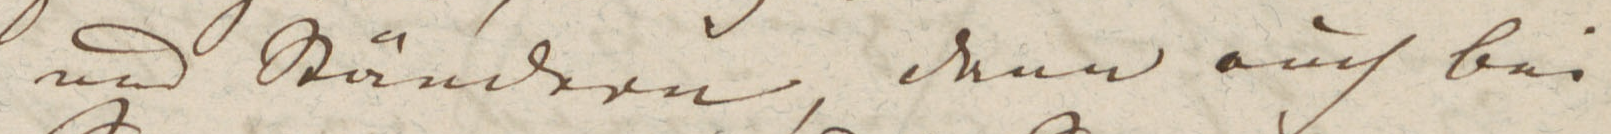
und Ständern, dann auch bei
